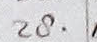28.
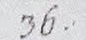36
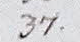37
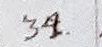34.
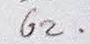62
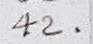42
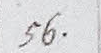56.
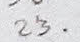23
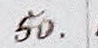50.
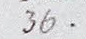36
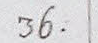36.
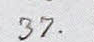37.
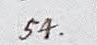54.
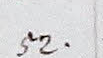52.
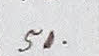51.
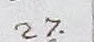27.
